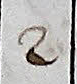2
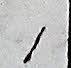1
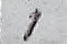1
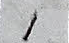1
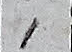1
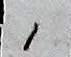1
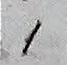1
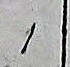1
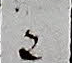2
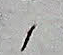1
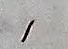1
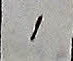1
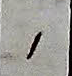1
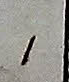1
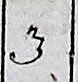3
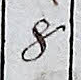8
